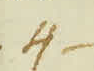4
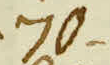70
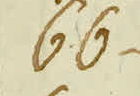66
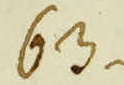63
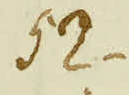52
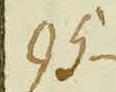95
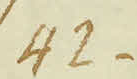42
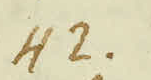42.
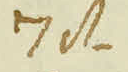78
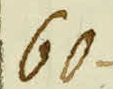60
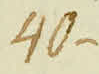40
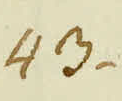43
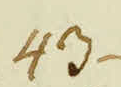43
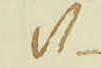8
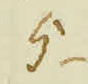5
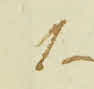1
